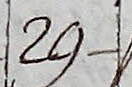29
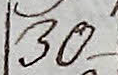30
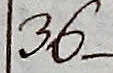36
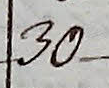30
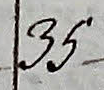35
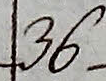36
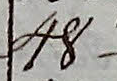48
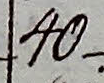40
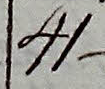41
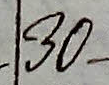30
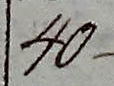40
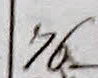76
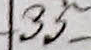35
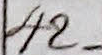42
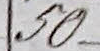50
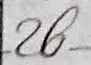26
